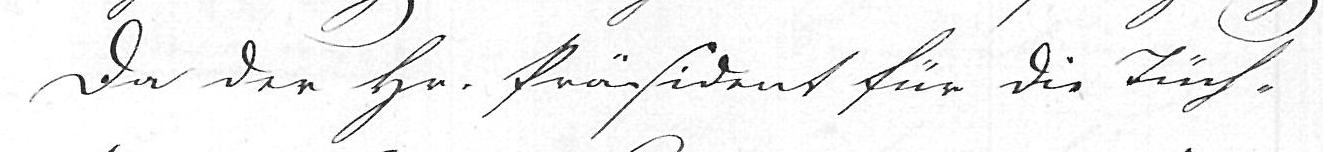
Da der Hr. Präsident für die Tüch-
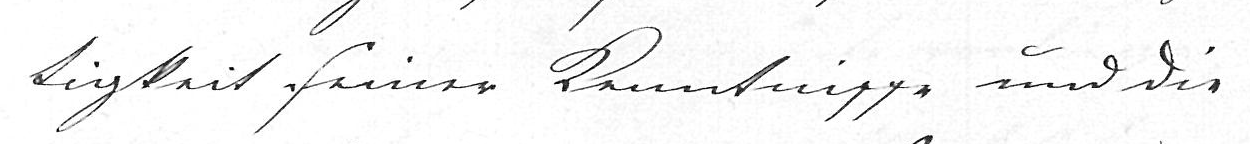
tigkeit seiner Kenntnisse und die
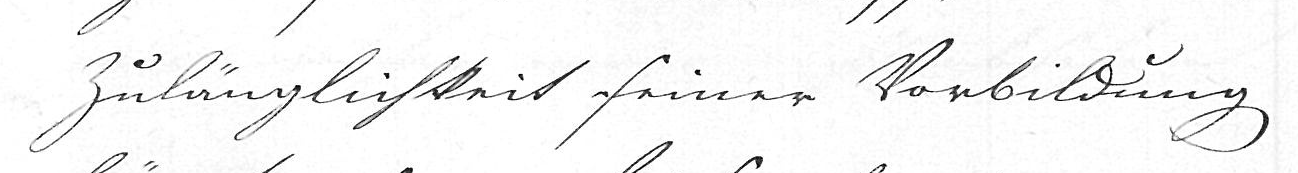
Zulänglichkeit seiner Vorbildung
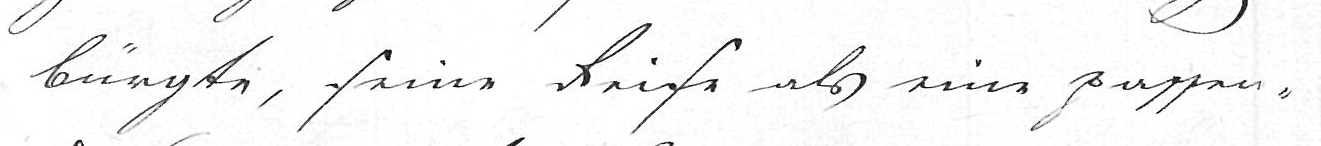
bürgte, seine Reise als eine passen-
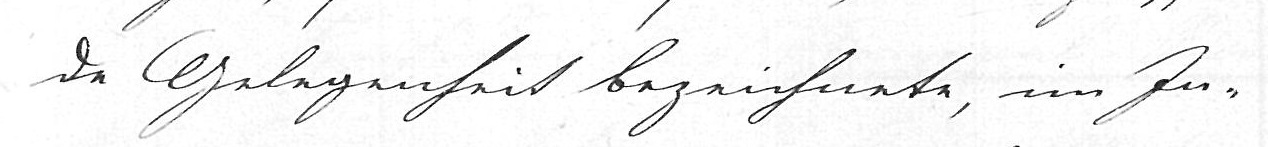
de Gelegenheit bezeichnete, im In-
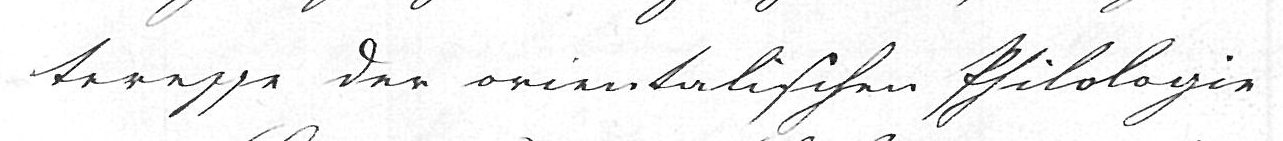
teresse der orientalischen Philologie
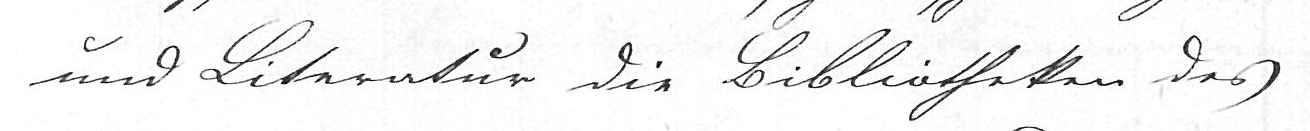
und Literatur die Bibliotheken des
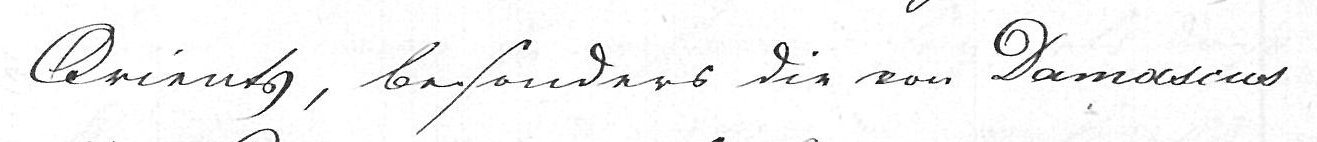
Orient, besonders die von Damascus
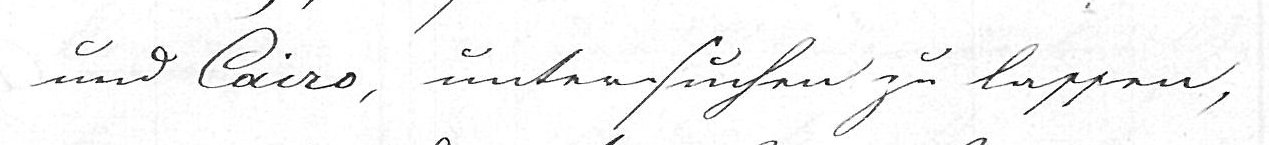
und Cairo, untersuchen zu lassen,
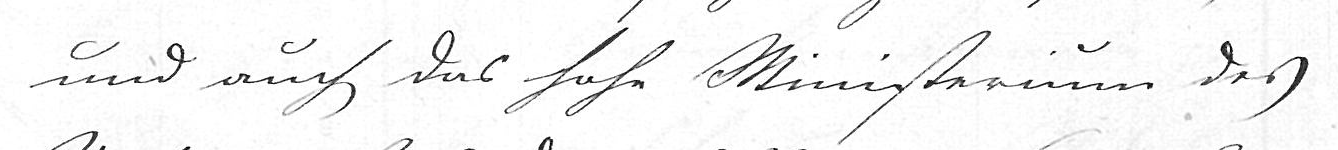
und auch das hohe Ministerium des
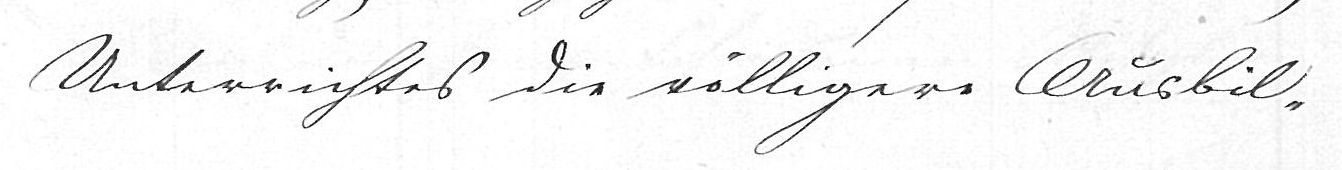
Unterrichtes die völligere Ausbil-
